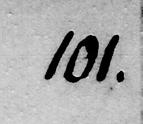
40.
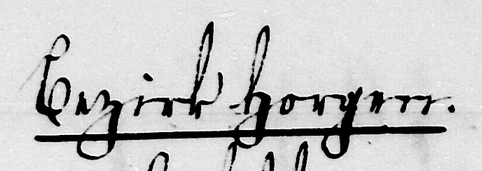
Bezirk Horgen.
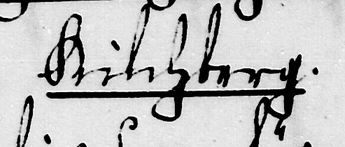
Kilchberg.
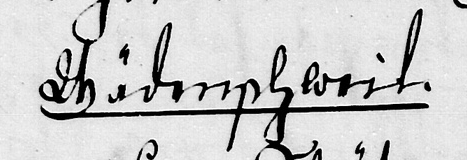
Wädenschweil.
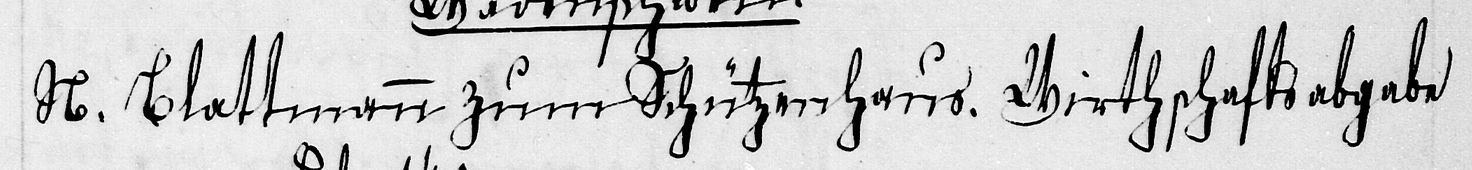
N. Blattmann zum Schützenhaus. Wirthschaftsabgabe
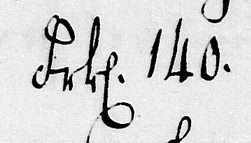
Frk[en]. 140.
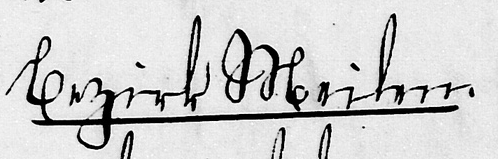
Bezirk Meilen.
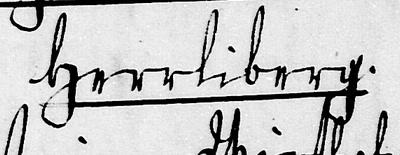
Herrliberg.
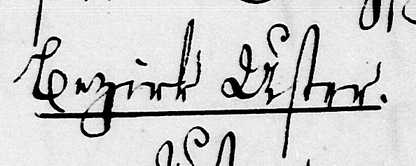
Bezirk Uster.
